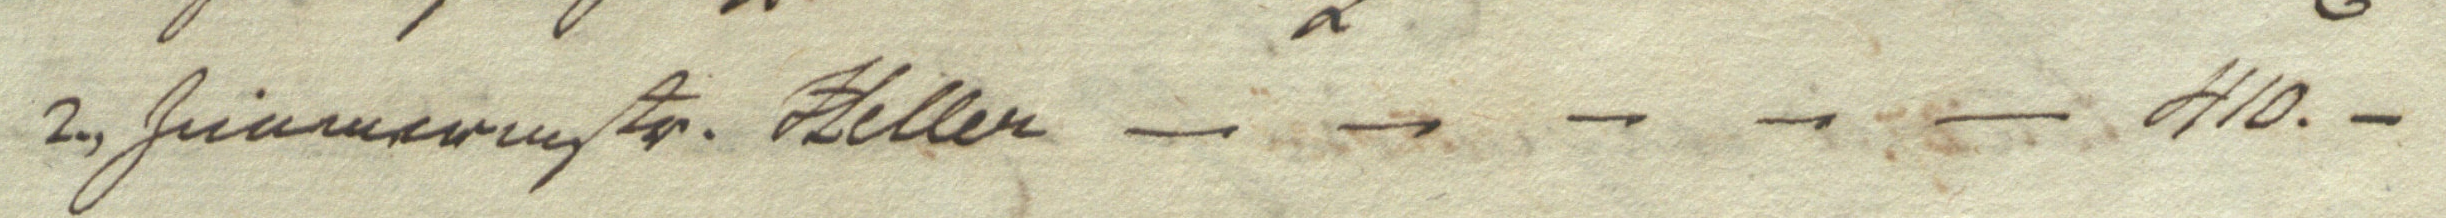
2., Zimmermstr. Heller ----- 410. -
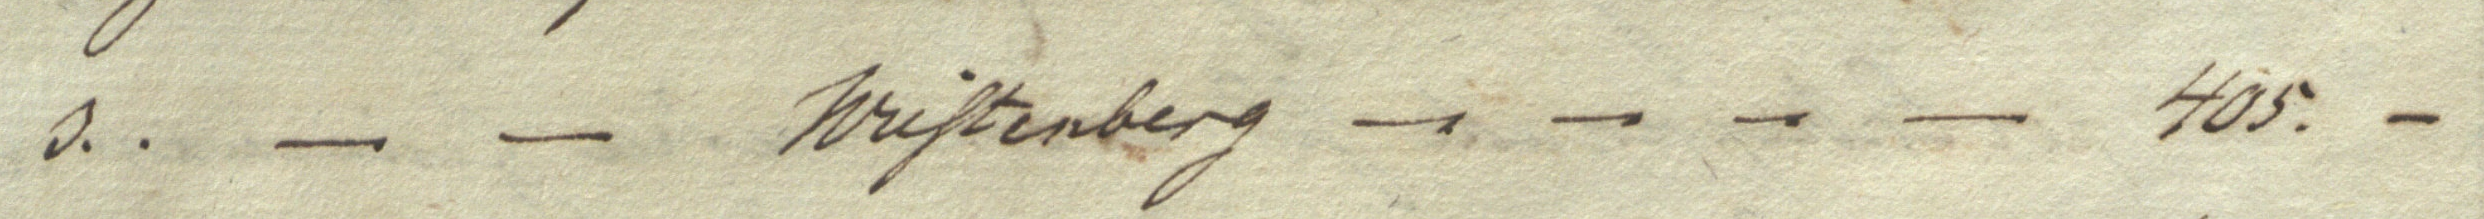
3.. -- Wistenberg ---- 405. -
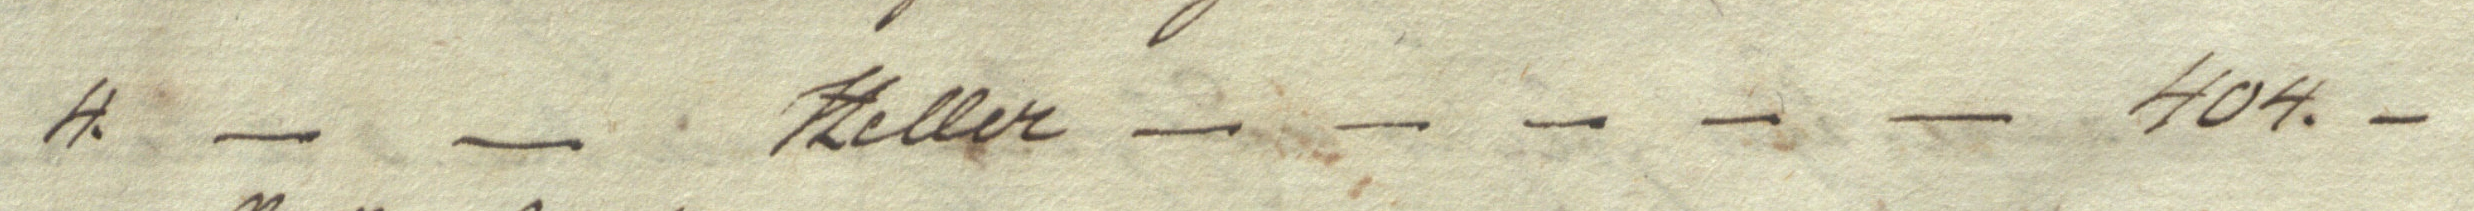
4. -- Heller ----- 404. -
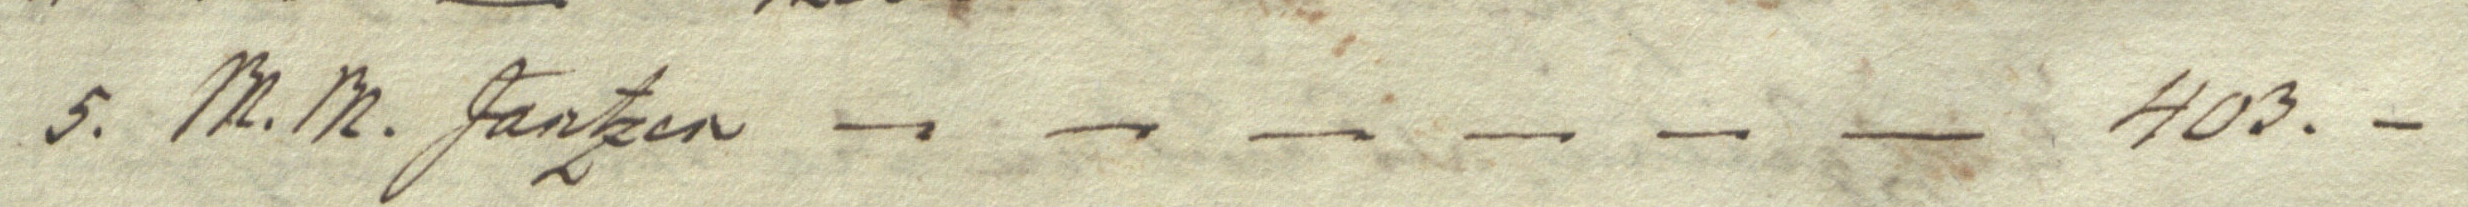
5. M. M. Jantzen ------ 403. -
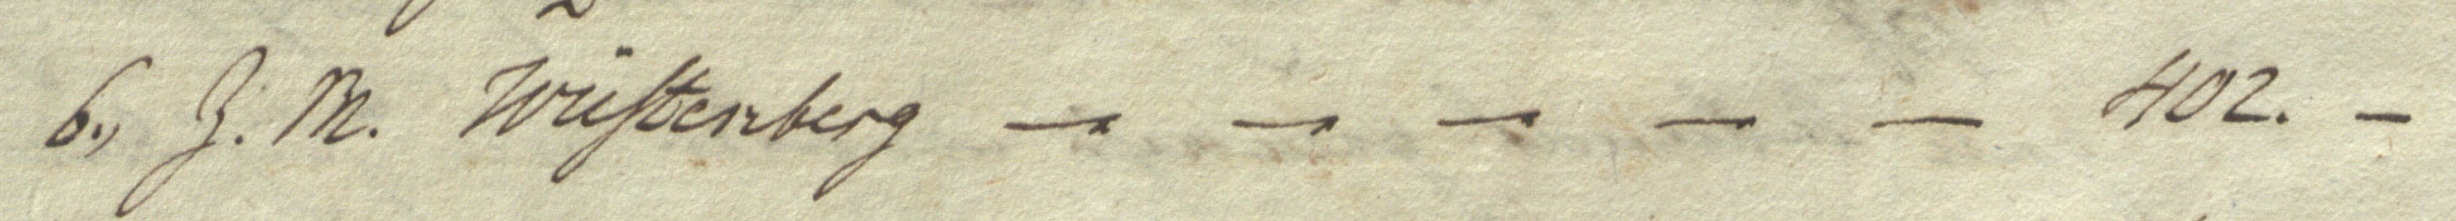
6. Z. M. Wüstenberg ----- 402. -
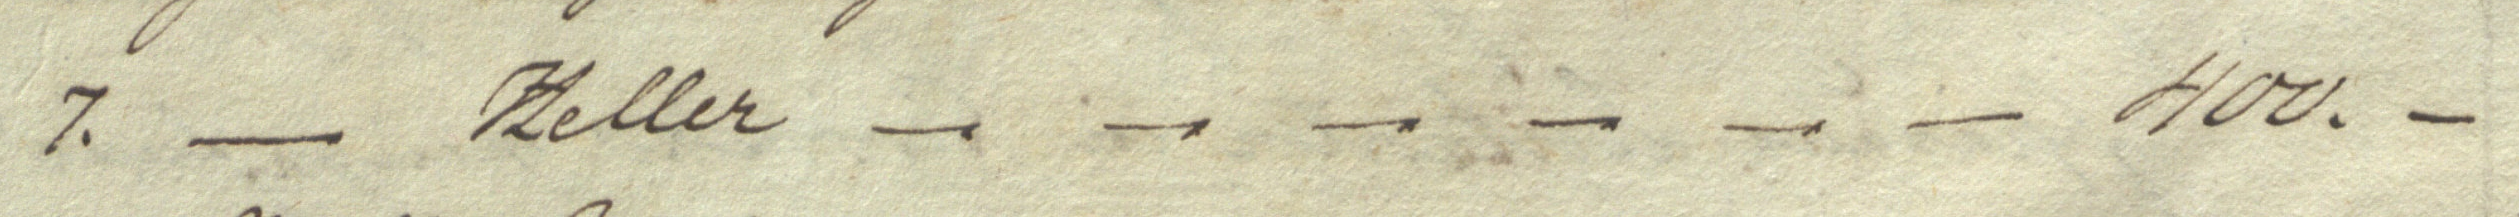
7. - Heller ------ 400. -
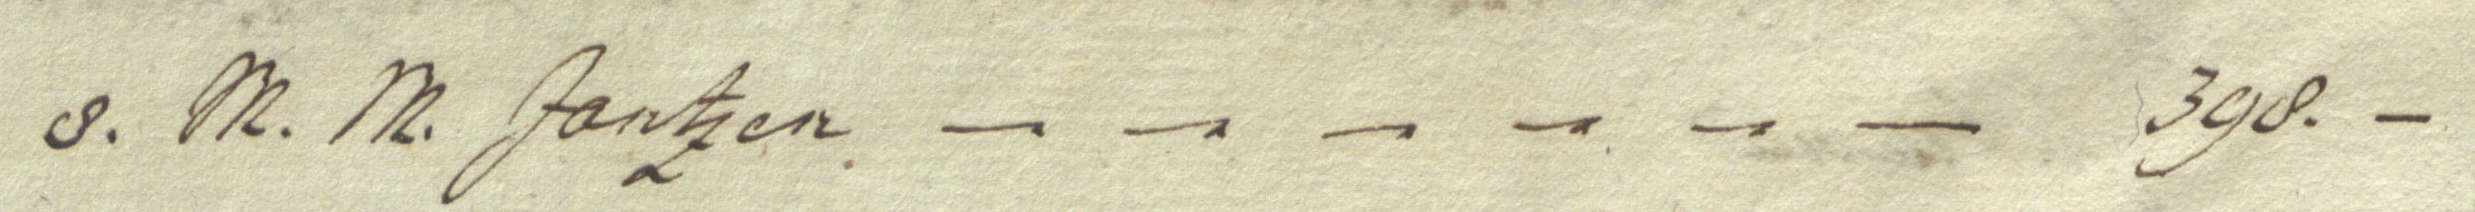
8. M. M. Jantzen ------ 398. -
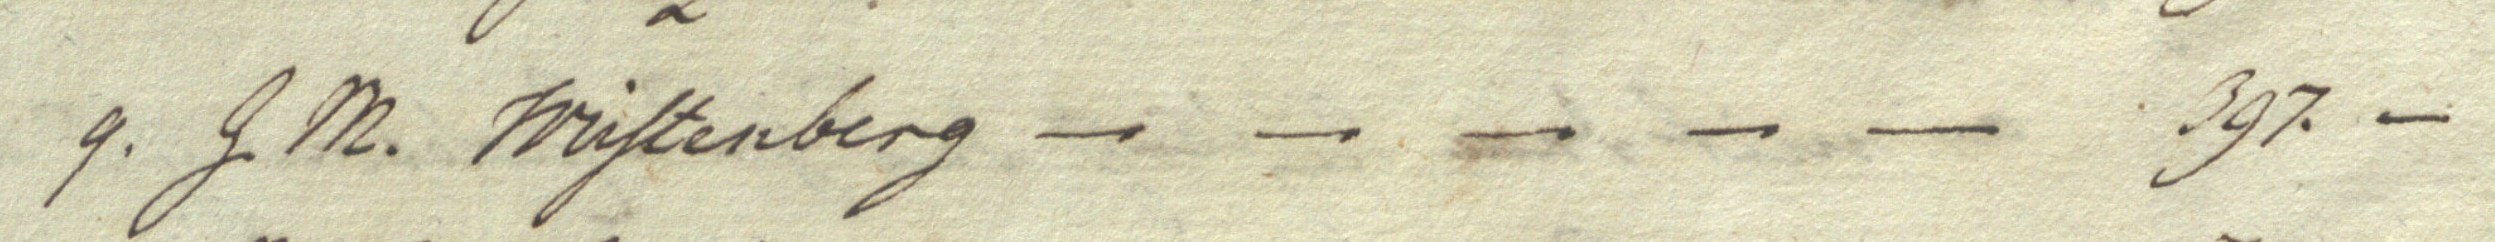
9. Z. M. Wistenberg ----- 397. -
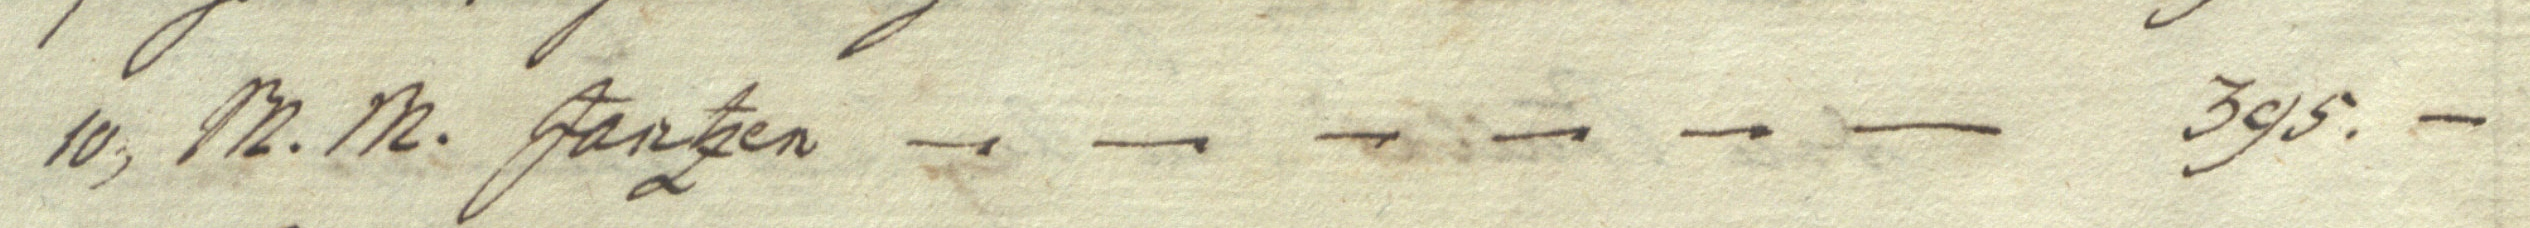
10, M. M. Jantzen ------ 395. -
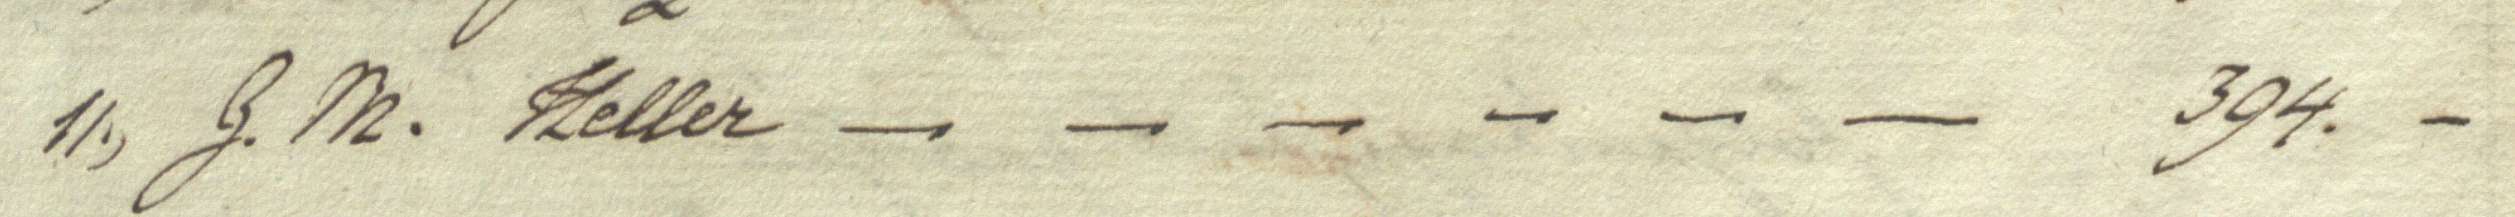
11., Z. M. Heller ------ 394. -
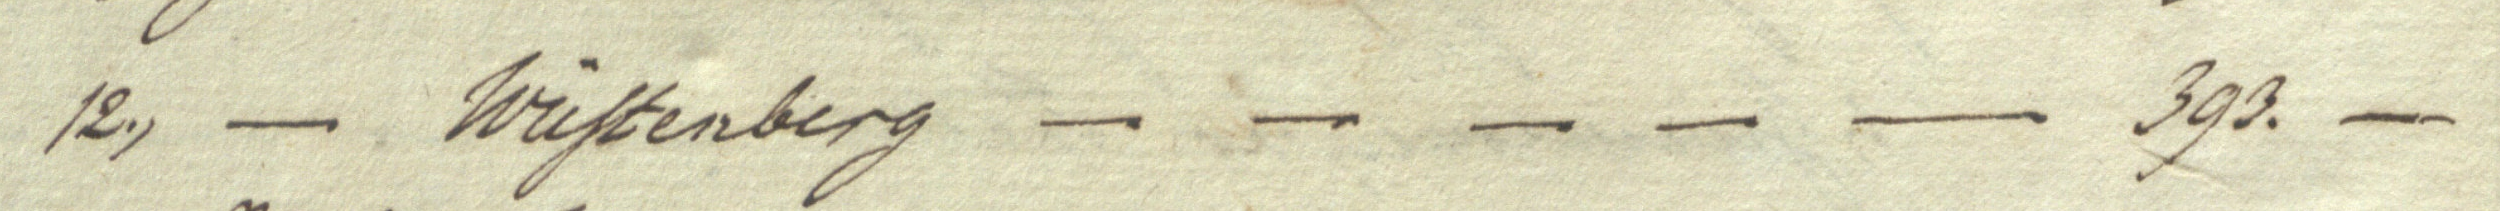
12., - Wüstenbertg ----- 393. -
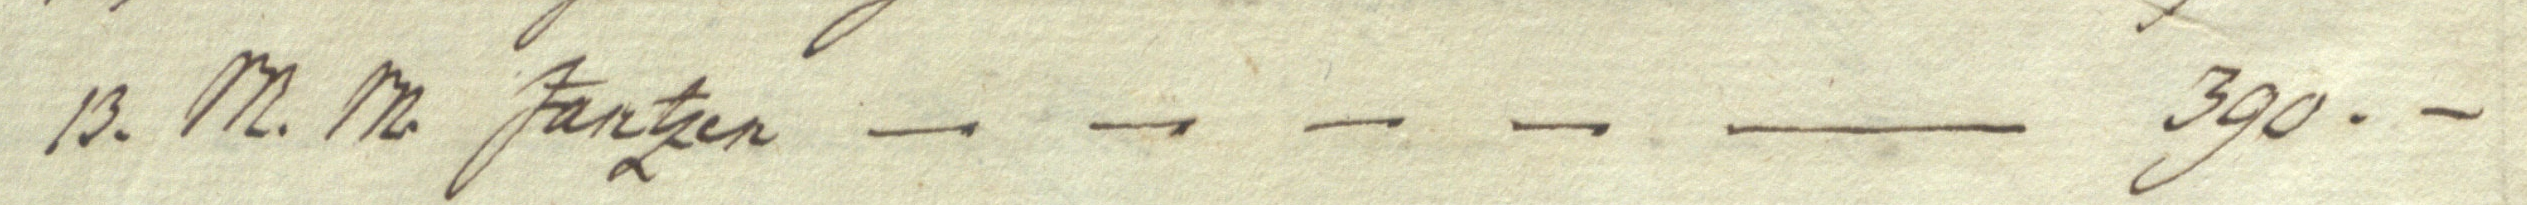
13. M. M. Jantzen ----- 390. -
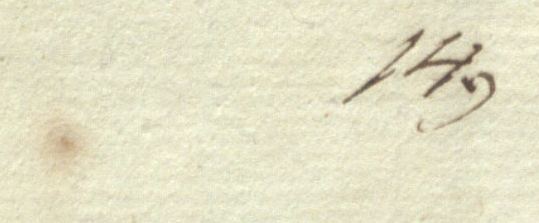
14.,
